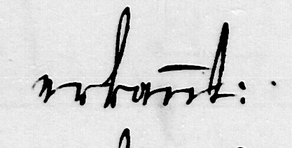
erkannt:
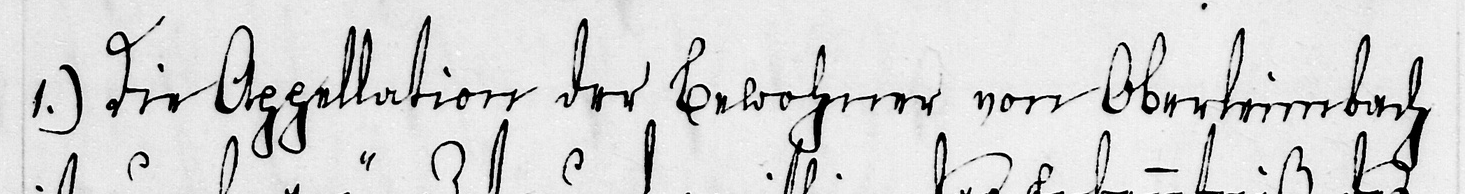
1.) Die Appellation der Bewohner von Oberleimbach
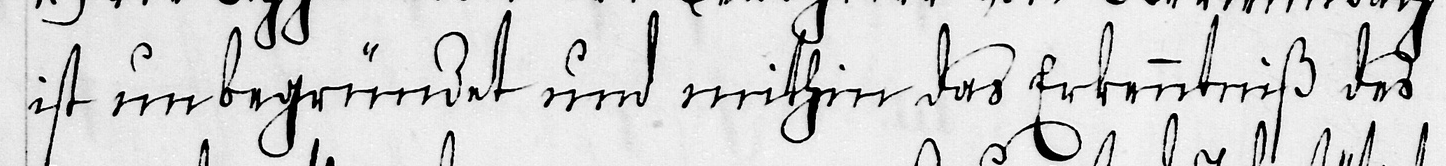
ist unbegründet und mithin das Erkenntniß des
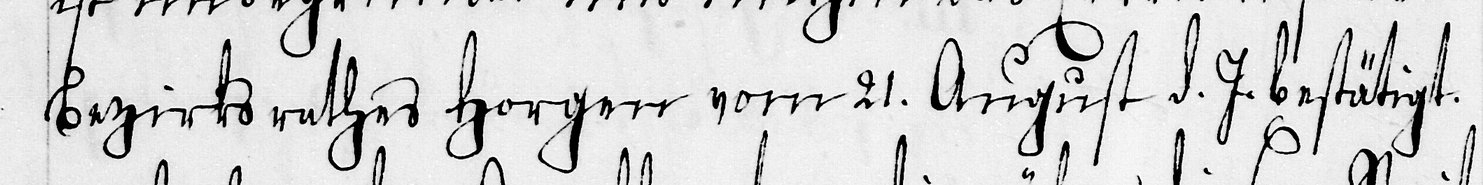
Bezirksrathes Horgen vom 21. August d. J. bestätigt.
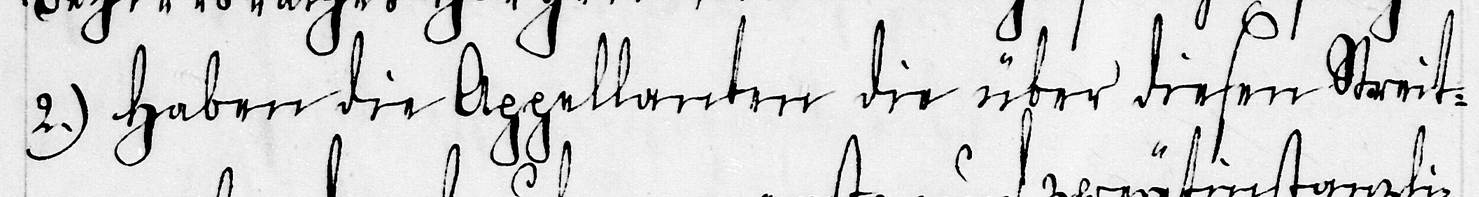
2.) Haben die Appellanten die über diesen Streit¬
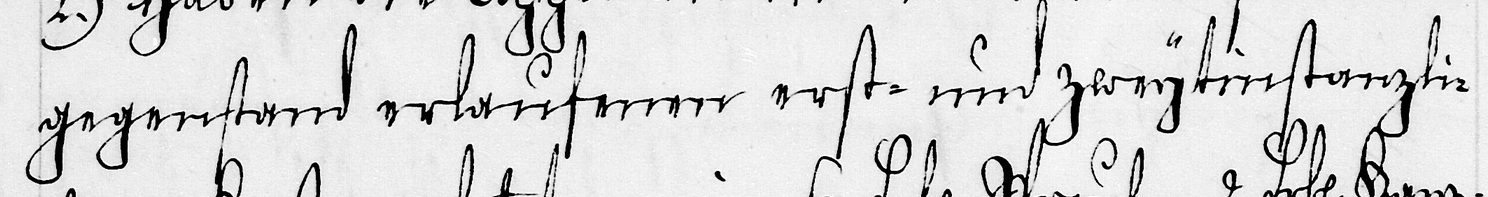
gegenstand erlaufenen erst- und zweytinstanzli¬
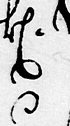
2.
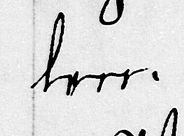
len.
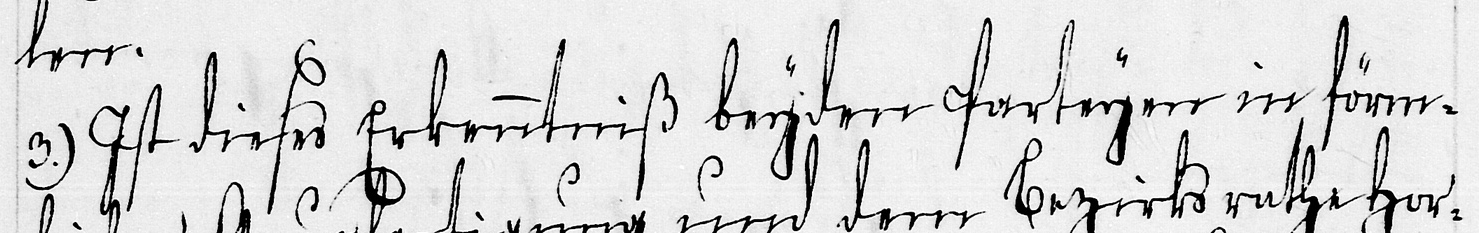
3.) Ist dieses Erkenntniß beyden Parteyen in förm¬
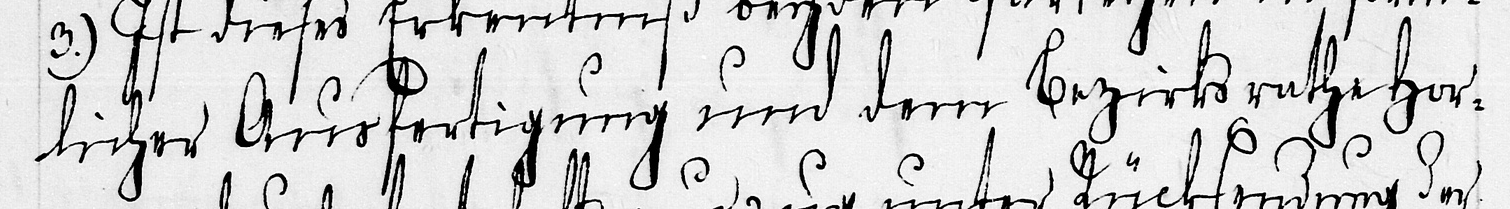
licher Ausfertigung und dem Bezirksrathe Hor¬
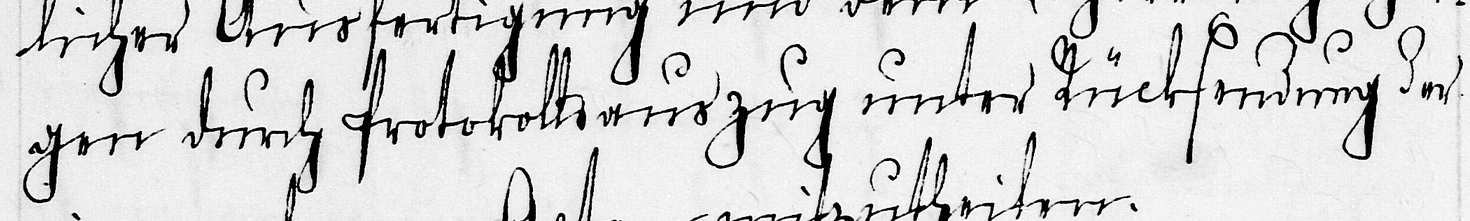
gen durch Protokollsauszug unter Rücksendung der
